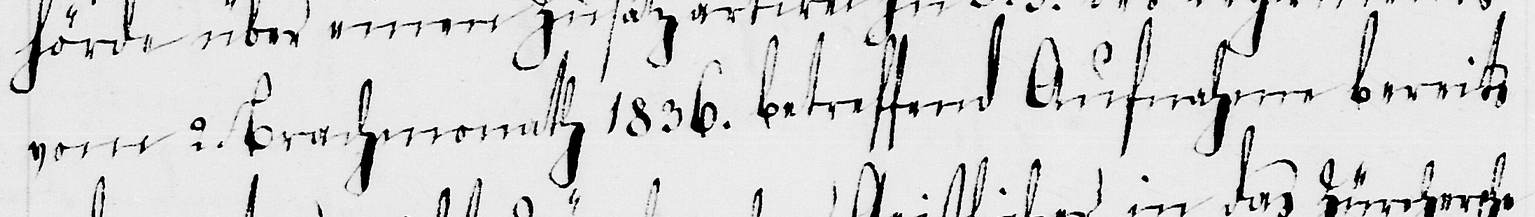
vom 2. Brachmonath 1836. betreffend Aufnahme bereits
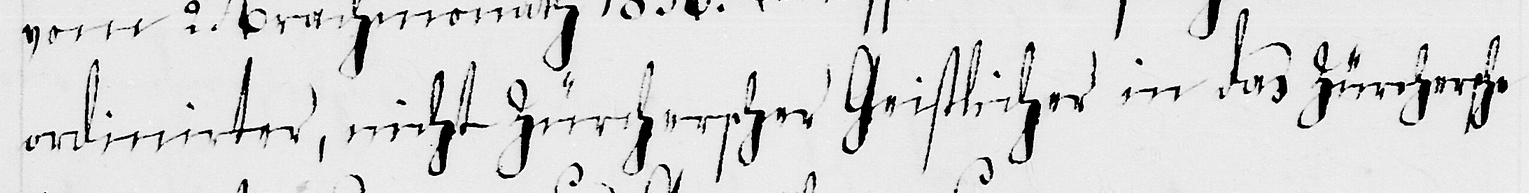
ordinierter, nicht Zürcherscher Geistlicher in das Zürchersc¬
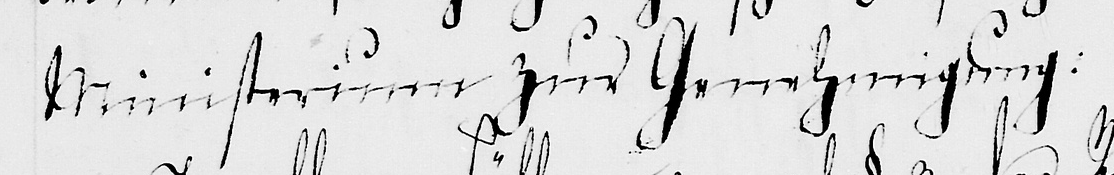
Ministerium zur Genehmigung:
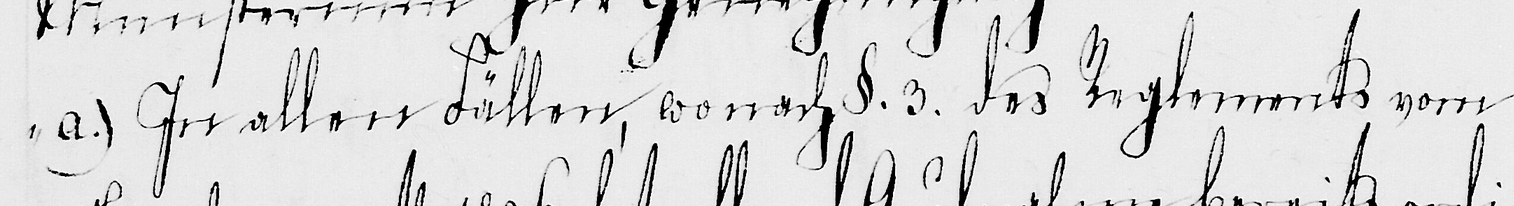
„a.) In allen Fällen, wonach §. 3. des Reglements vom
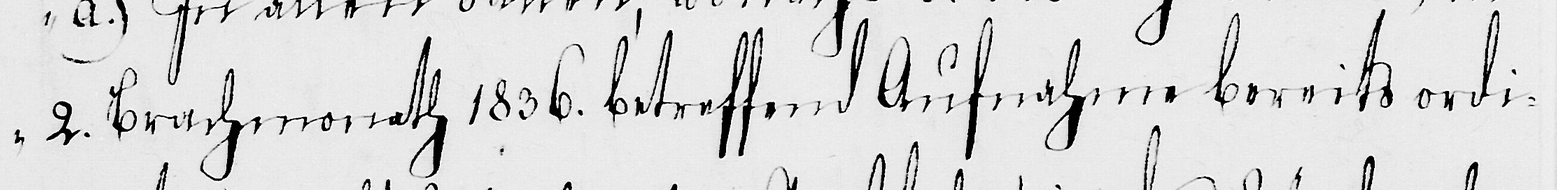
2. Brachmonath 1836. betreffend Aufnahme bereits ordi¬
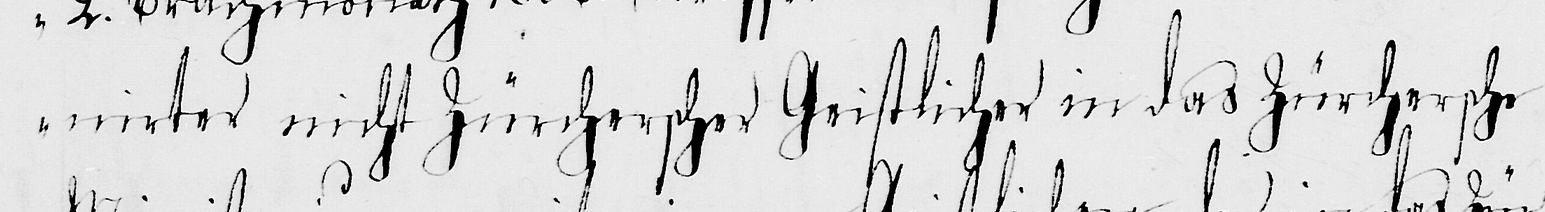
nierter nicht Zürcherscher Geistlicher in das Zürchersche
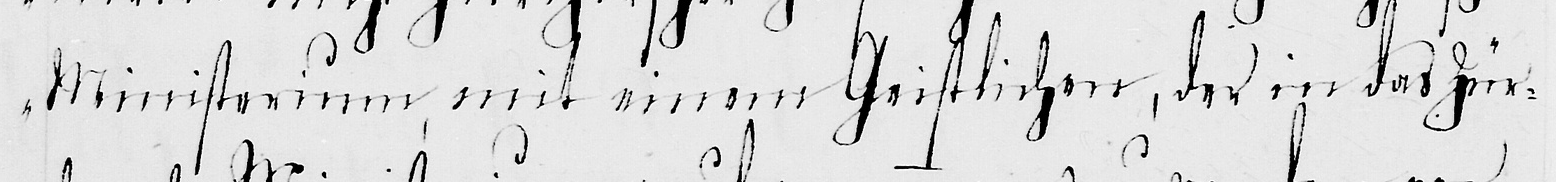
Ministerium mit einem Geistlichen, der in das Zür¬
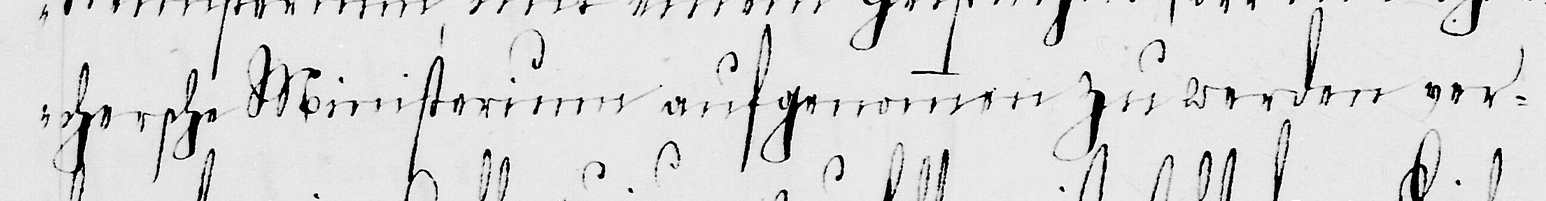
chersche Ministerium aufgenommen zu werden ver¬
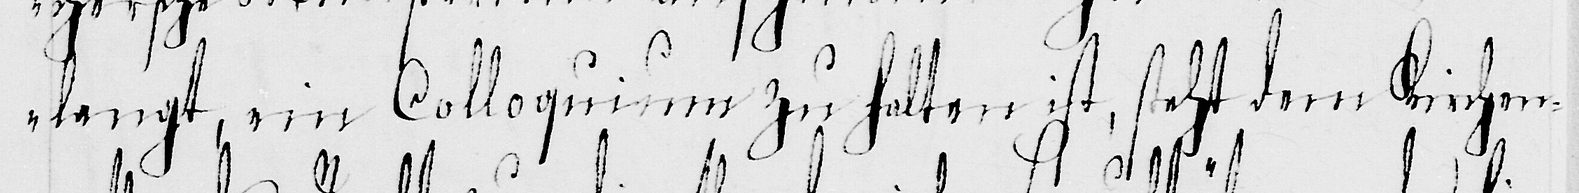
langt, ein Colloquium zu halten ist, steht dem Kirchen¬
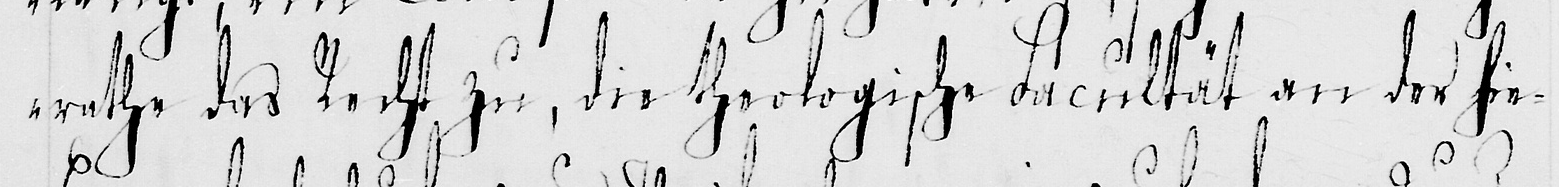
rathe das Recht zu, die theologische Facultät an der hi¬
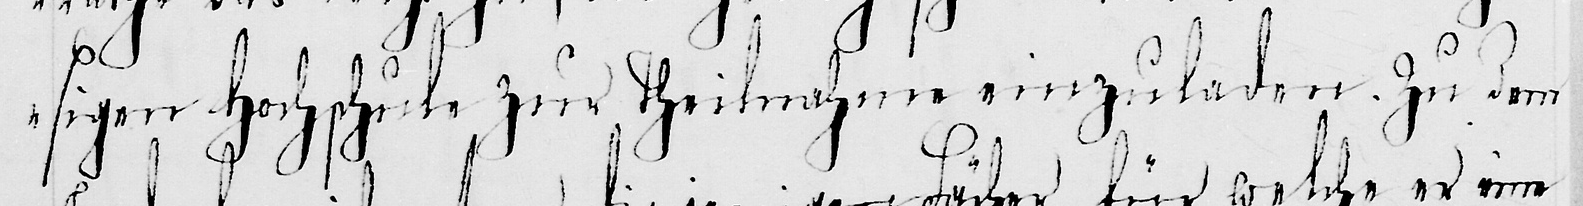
esigen Hochschule zur Theilnahme einzuladen. Zu dem
